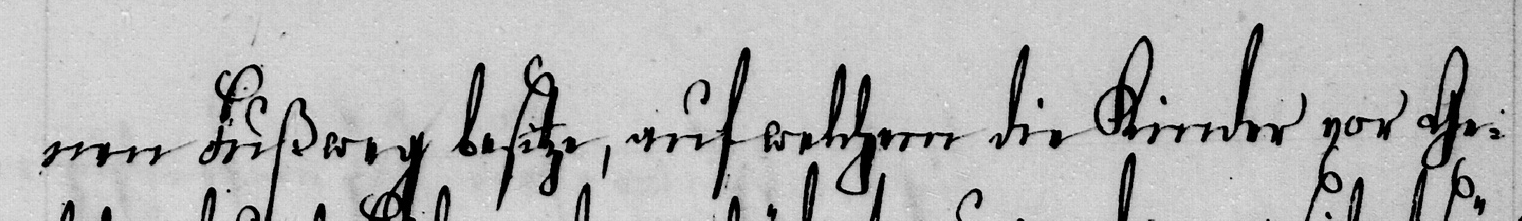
nen Fußweg besitze, auf welchem die Kinder vor Gef¬
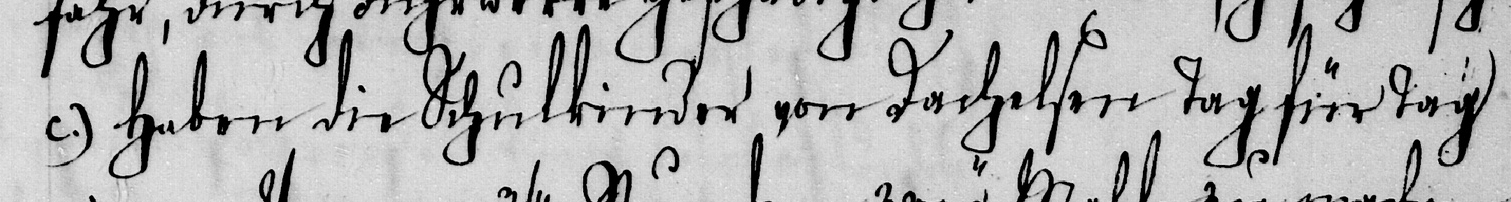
c.) Haben die Schulkinder von Dachelsen Tag für Tag
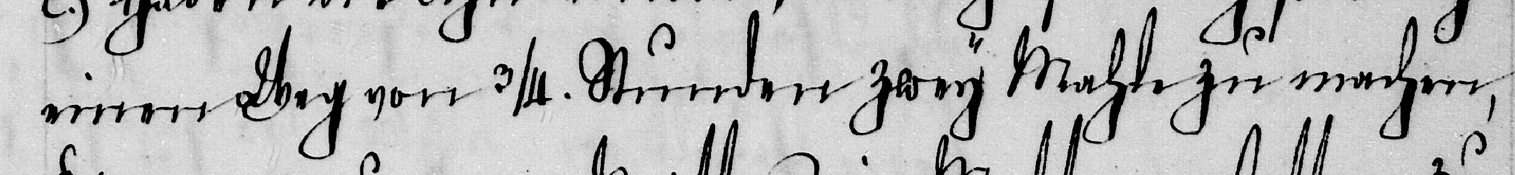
einen Weg von 3/4. Stunden zwey Mahle zu machen,
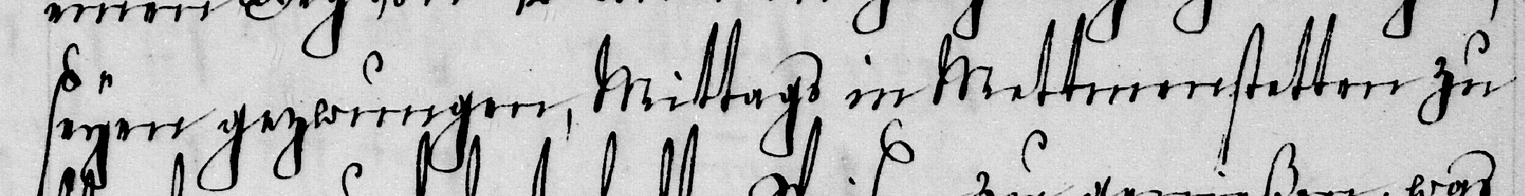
seyen gezwungen, Mittags in Mettmenstetten zu
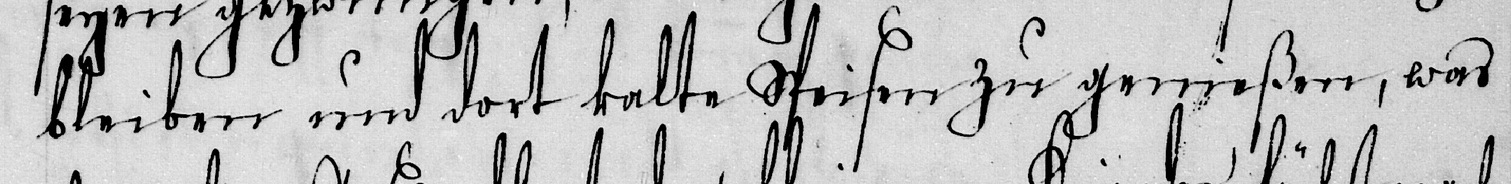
bleiben und dort kalte Speisen zu genießen, was
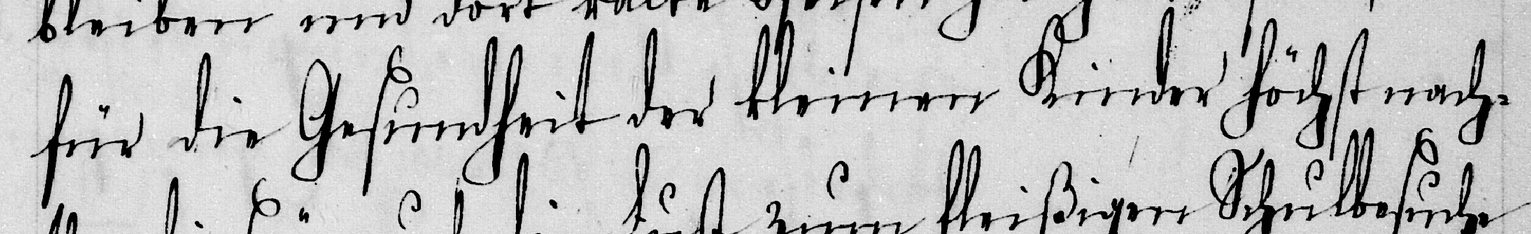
für die Gesundheit der kleinen Kinder höchst nach¬
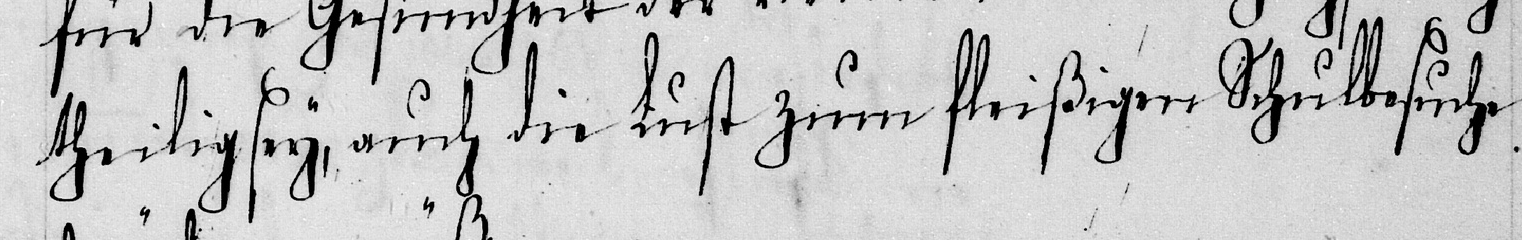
theilig sey, auch die Lust zum fleißigen Schulbesuche
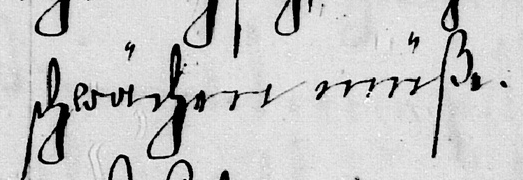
schwächen müße.
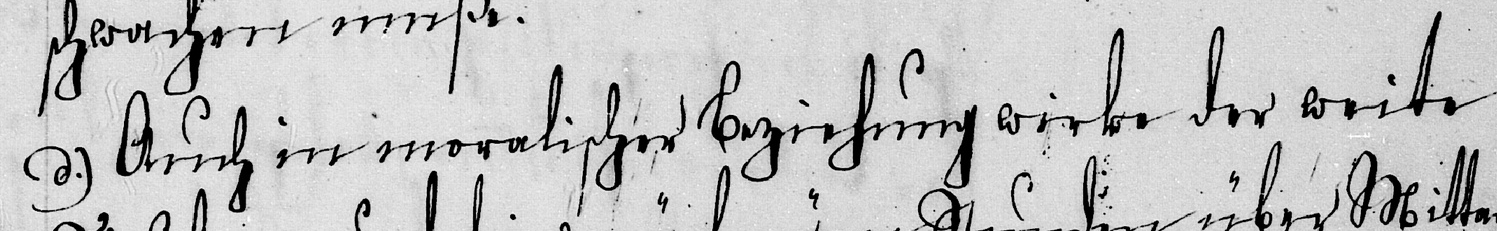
d.) Auch in moralischer Beziehung wirke der weite
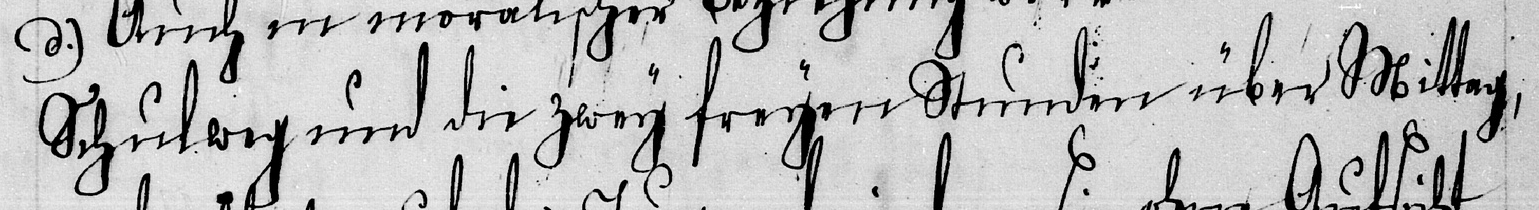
Schulweg und die zwey freyen Stunden über Mittag,
